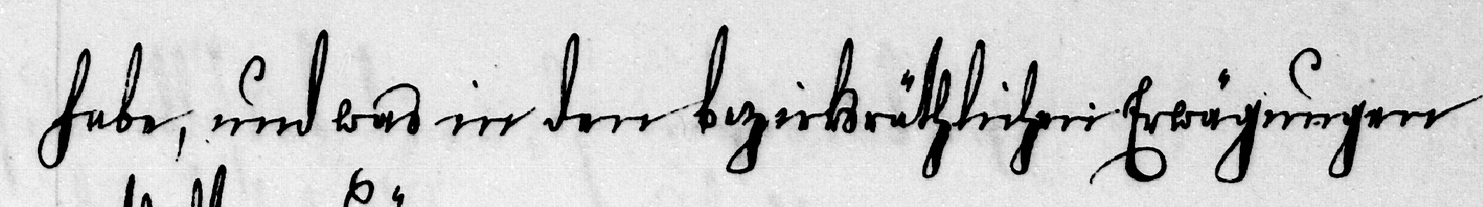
habe, und was in den bezirksräthlichen Erwägungen
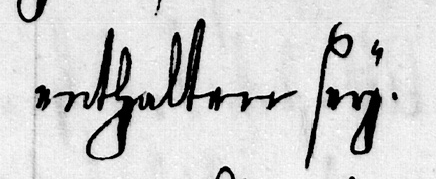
enthalten sey.
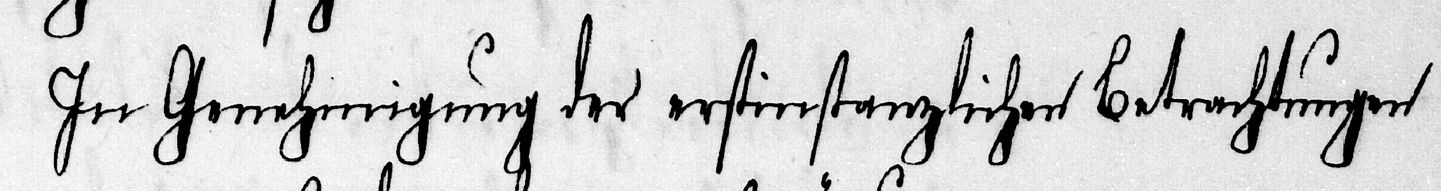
In Genehmigung der erstinstanzlichen Betrachtungen
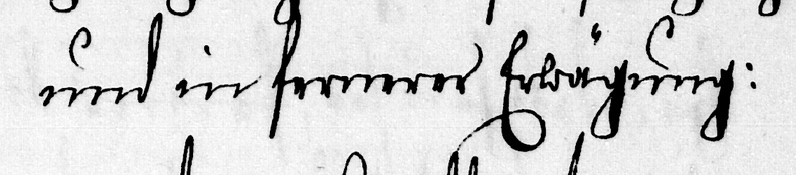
und in fernerer Erwägung:
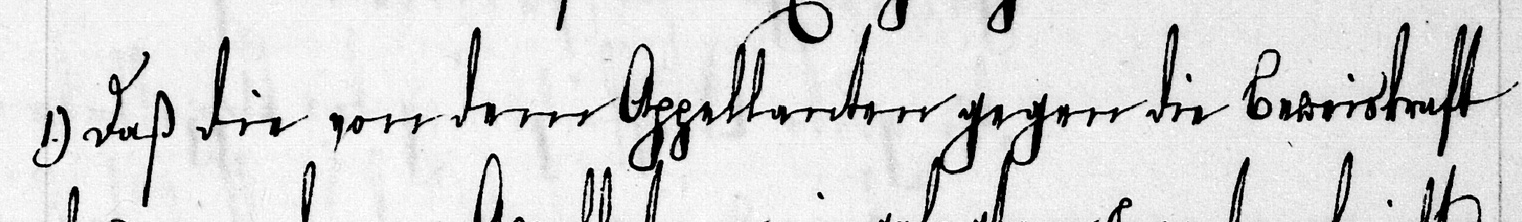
1.) Daß die von dem Appellanten gegen die Beweiskraft
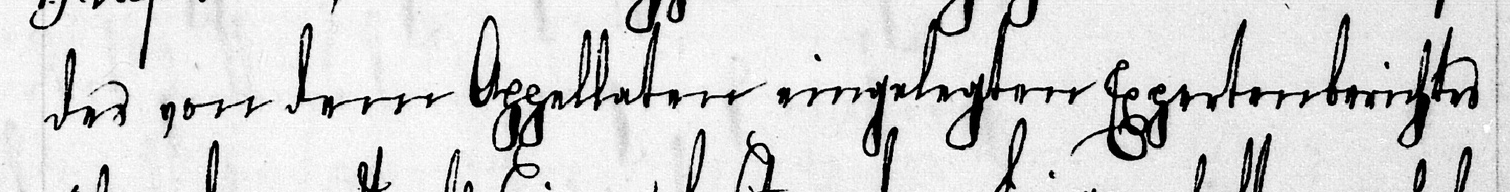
des von dem Appellaten eingelegten Expertenberichtes
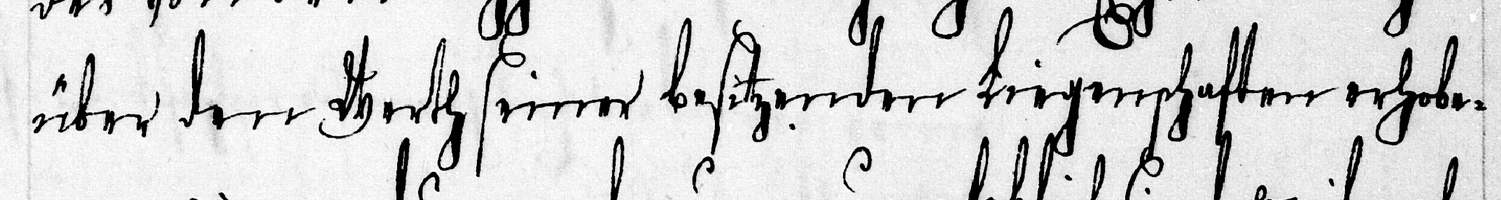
über den Werth seiner besitzenden Liegenschaften erhobe¬
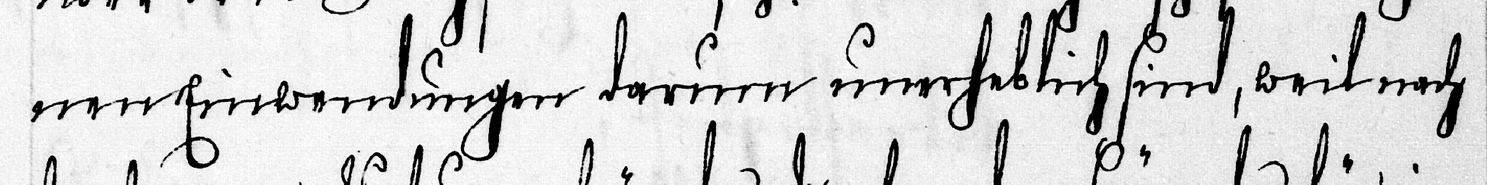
nen Einwendungen darum unerheblich sind, weil nach
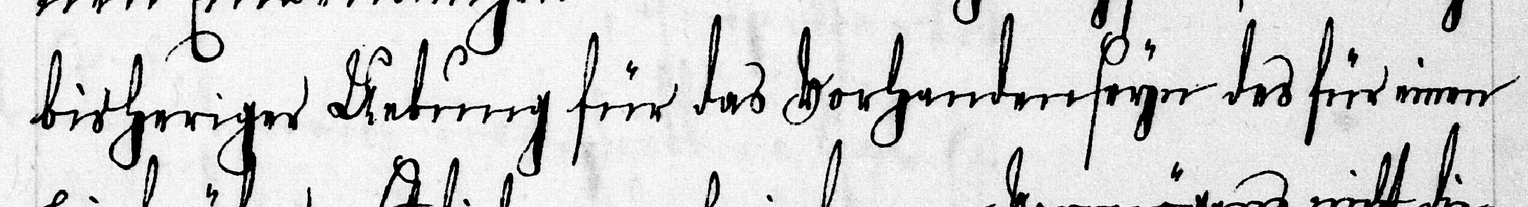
bisheriger Uebung für das Vorhandenseyn des für einen
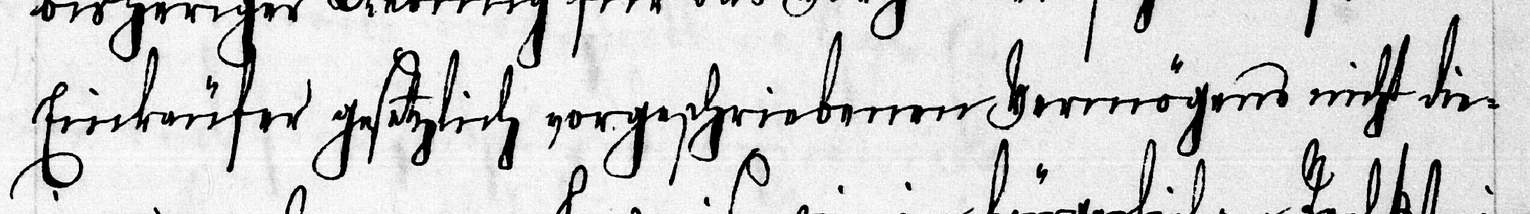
Einkäufer gesetzlich vorgeschriebenen Vermögens nicht die¬
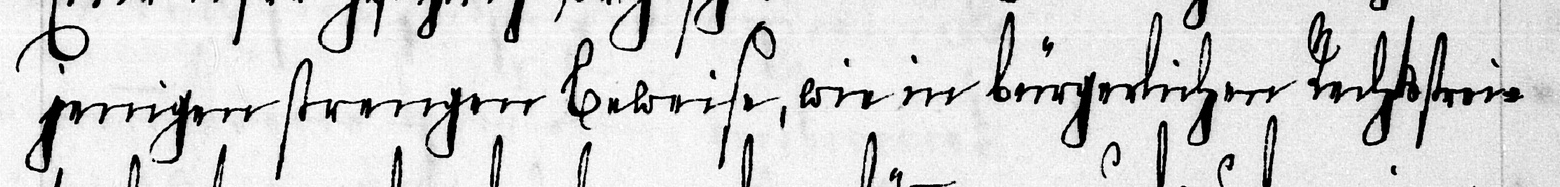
jenigen strengen Beweise, wie in bürgerlichen Rechtsstre¬
